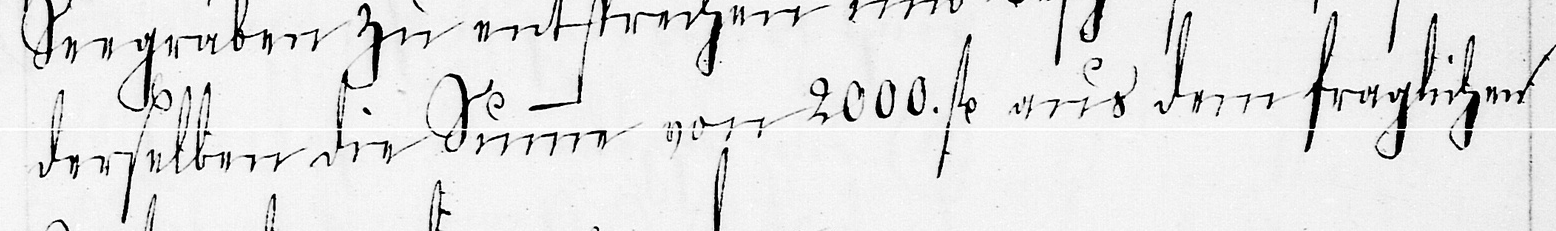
derselben die Summe von 2000. fl. aus dem fraglichen
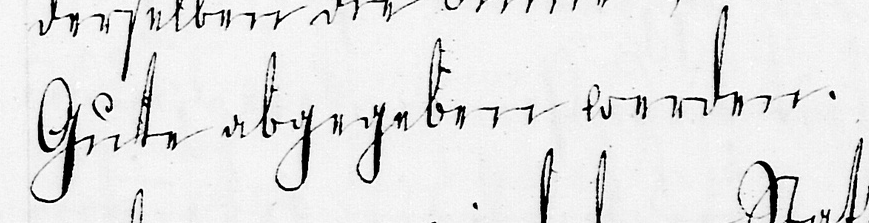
Gute abgegeben werden.
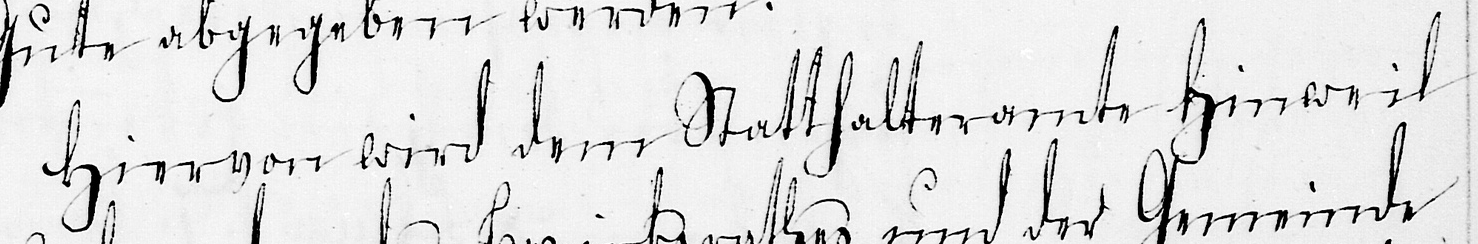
Hiervon wird dem Statthalteramte Hinweil
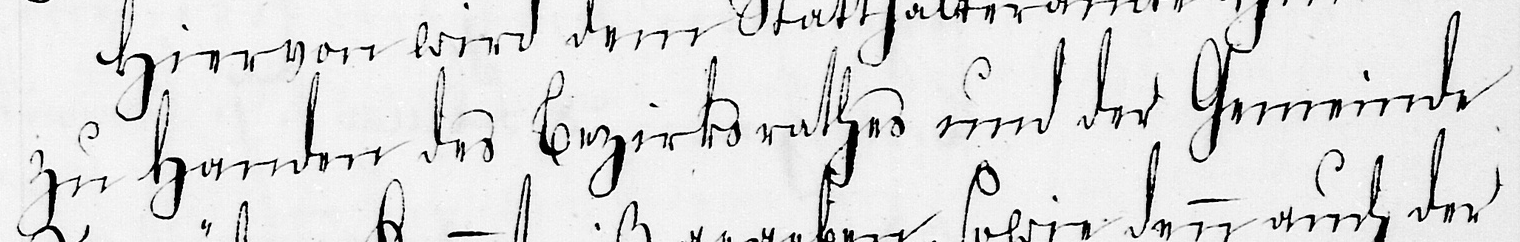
zu Handen des Bezirksrathes und der Gemeinde
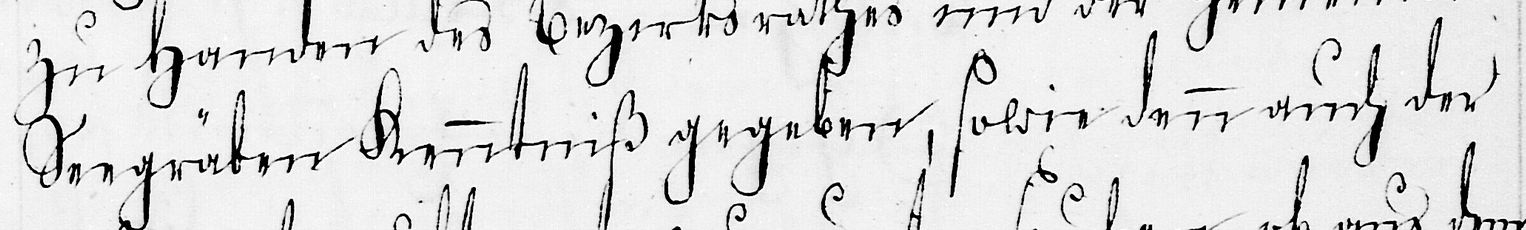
Seegräben Kenntniß gegeben, sowie denn auch der
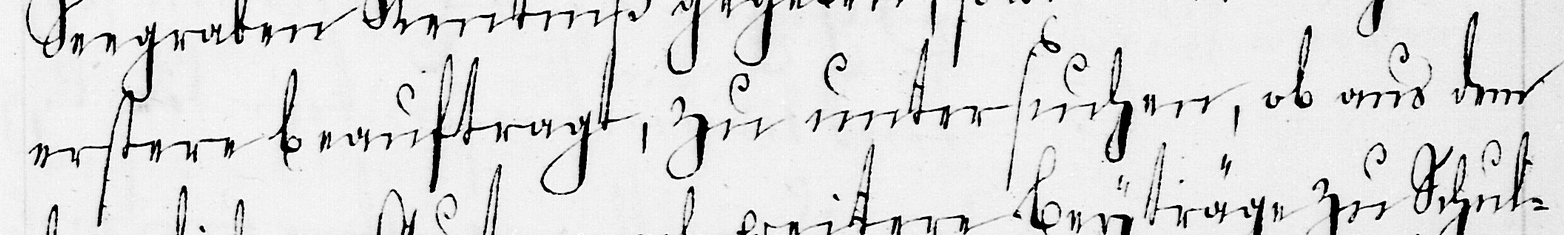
erstere beauftragt, zu untersuchen, ob aus dem
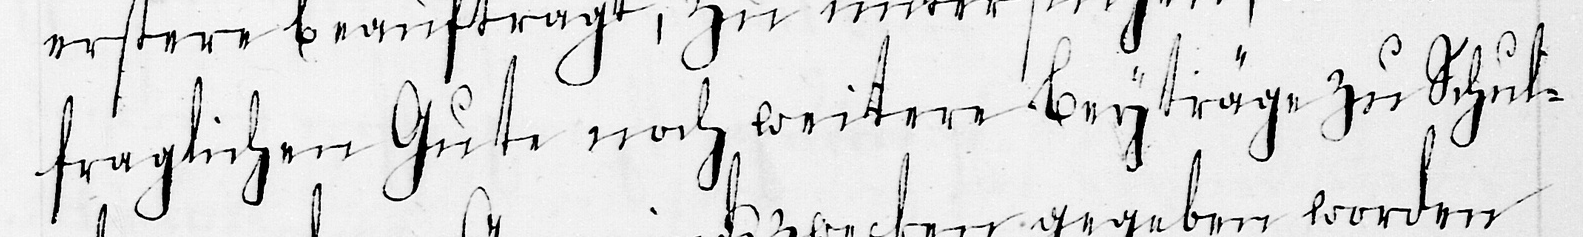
fraglichen Gute noch weitere Beyträge zu Schul-
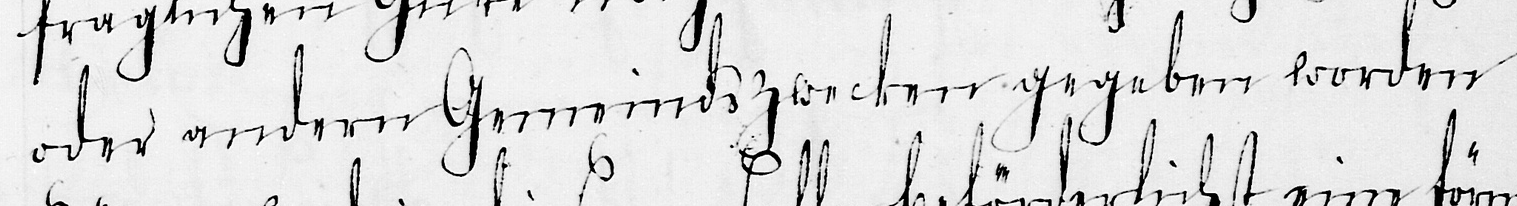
oder andern Gemeindszwecken gegeben worden
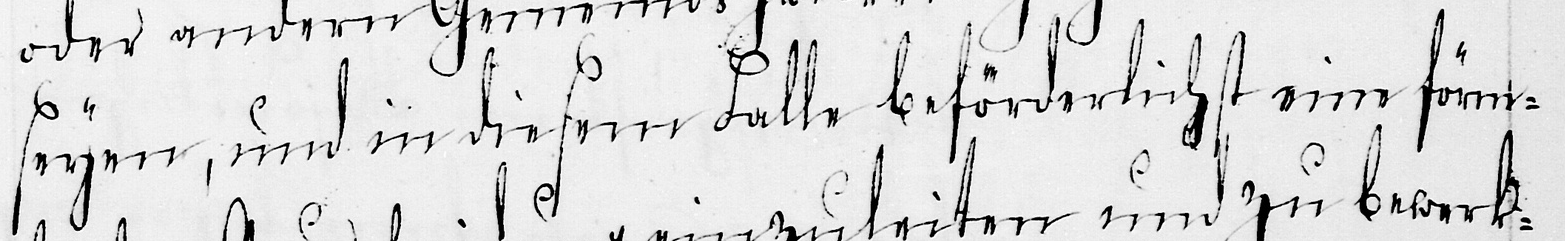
seyen, und in diesem Falle beförderlichst eine förm¬
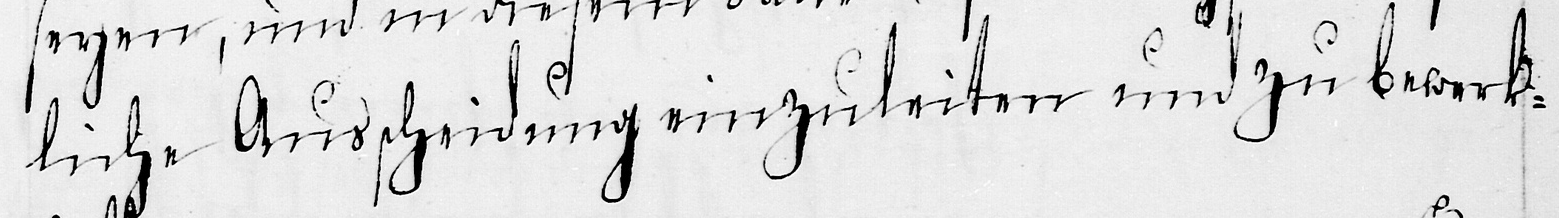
liche Ausscheidung einzuleiten und zu bewerk¬
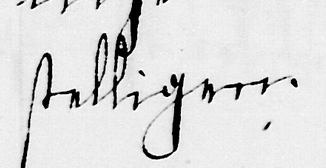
stelligen.
